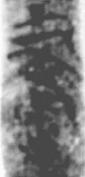○（畫）
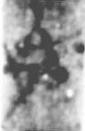○（伐）
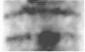二
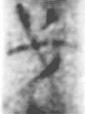戈
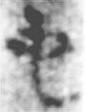屯
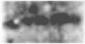一
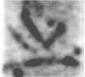之
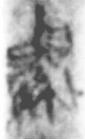顯（韅）
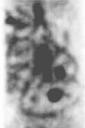○（貂）
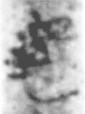○（鞍）
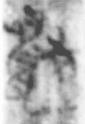○（豻）
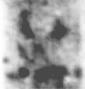之
